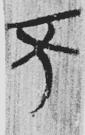不
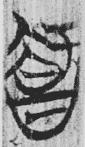○（知）
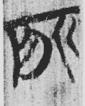所
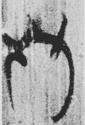夂（終）
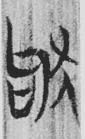狗（耉）
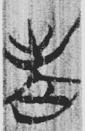老
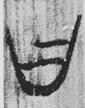曰
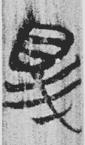眊眊
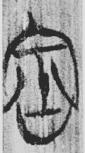○（余）
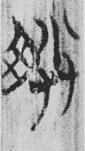朕
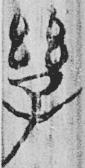孳
